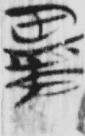異
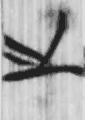之
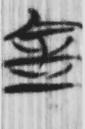金
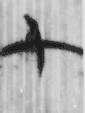七
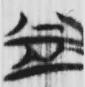益
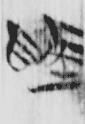陵
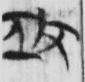攻
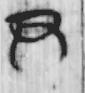尹
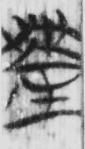產
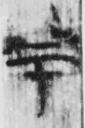主
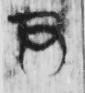尹
